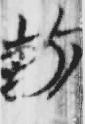新
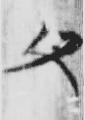父
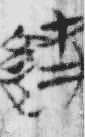既
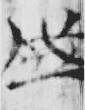城（成）
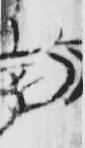新
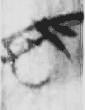母
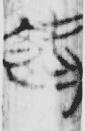既
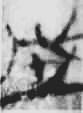城（成）
